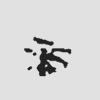不
